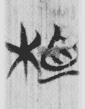相
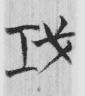{工戈}
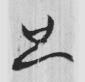也
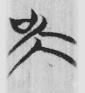吳
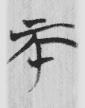帀
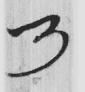乃
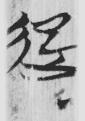{辶巳}
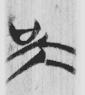吳
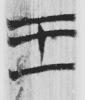王
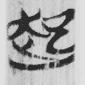起
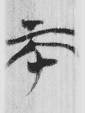帀
